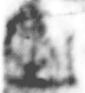○（衡）
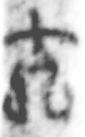戹（軛）
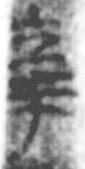韋
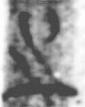之
